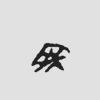室
